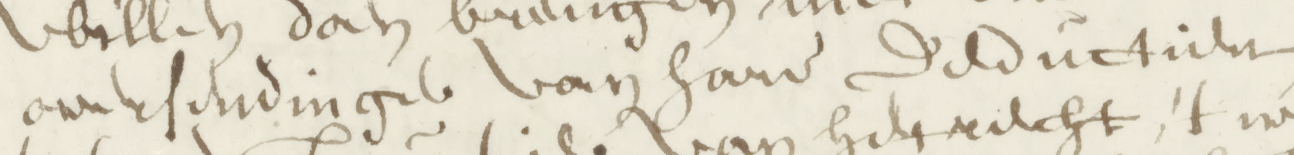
oversendinge van hare Deductien
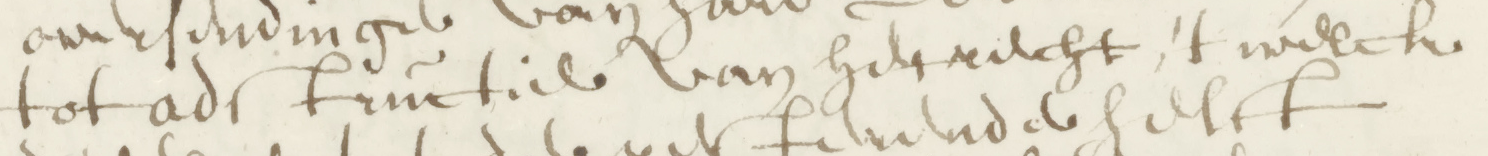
tot adstructie van het recht, 't welck
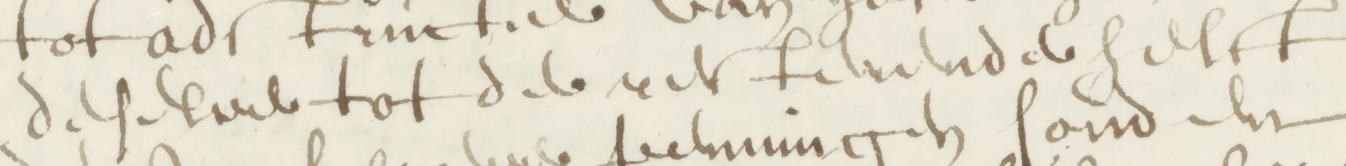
deselve tot de resterende helft
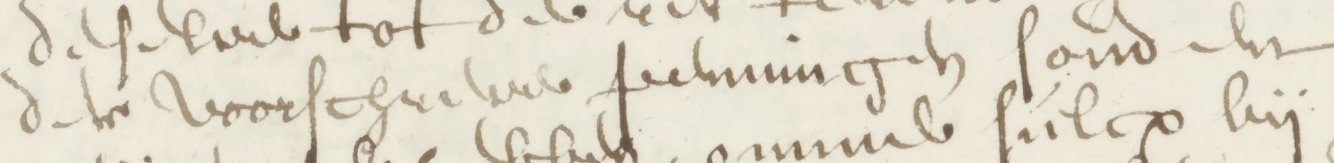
der voorschreve penningen souden
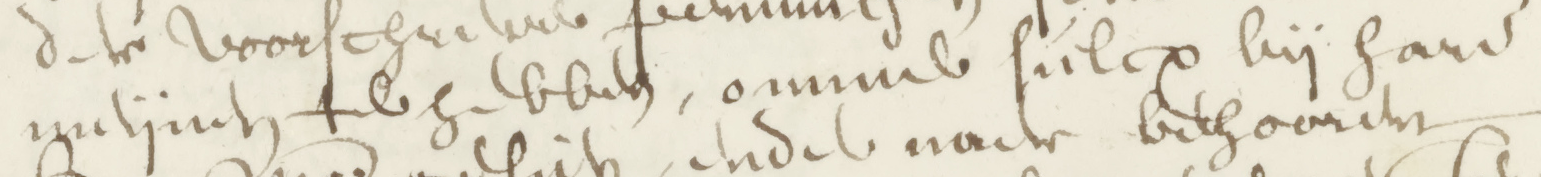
meijnen te hebben, omme sulcx bij hare
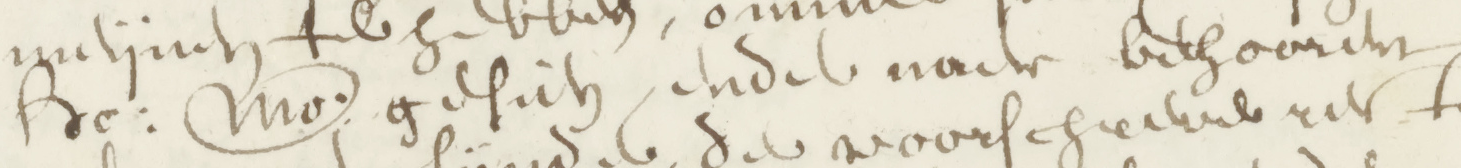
Ho:Mo: gesien, ende naer behooren
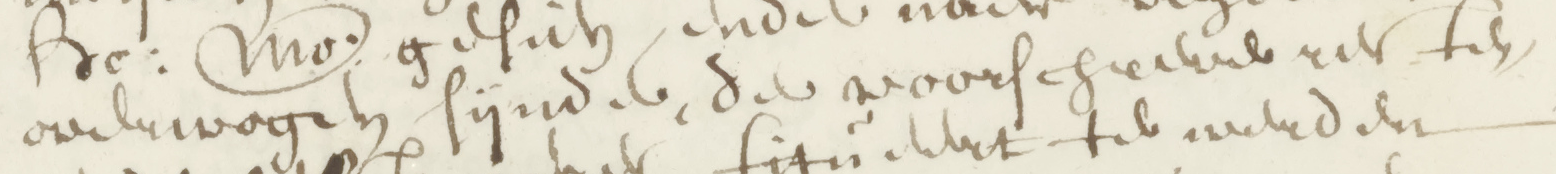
overwogen sijnde, de voorschreve reste,
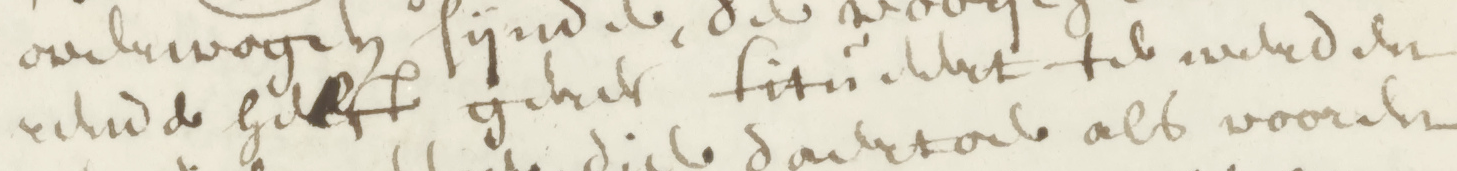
rende helft gerestitueert te werden
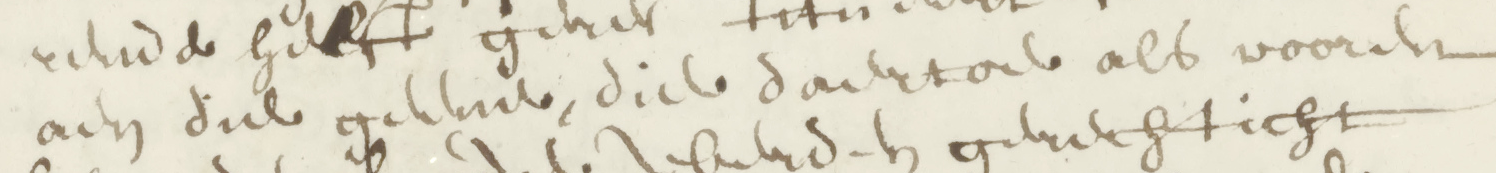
aen die geene, die daertoe als vooren
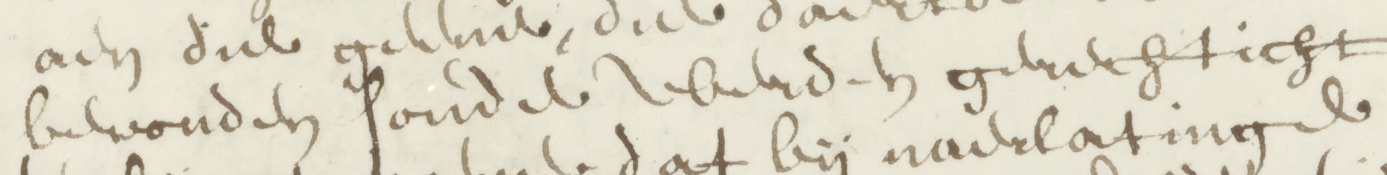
bevonden soude werden gerechticht
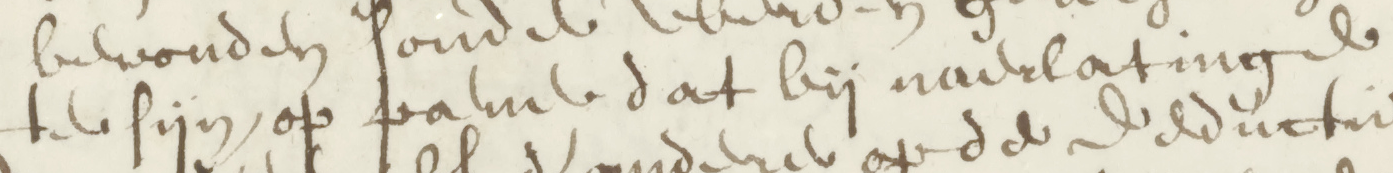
te sijn, op pæne dat bij naerlatinge
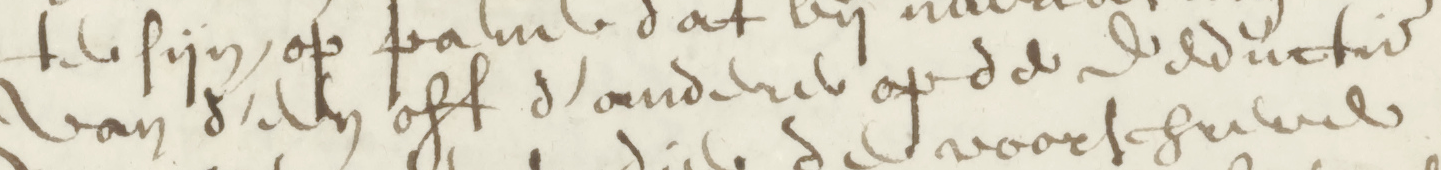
van d‛een oft d'andere opde Deductie
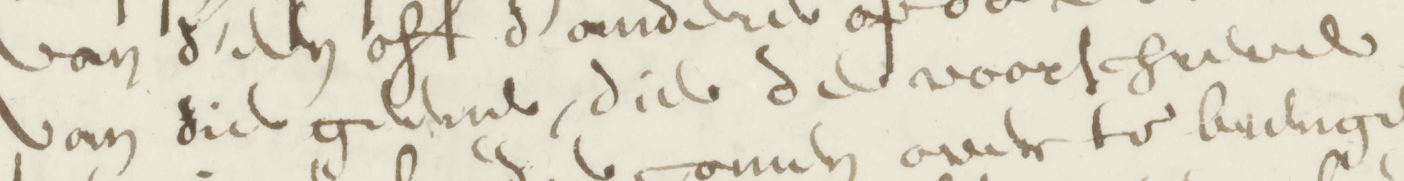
van die geene, die de voorschreve
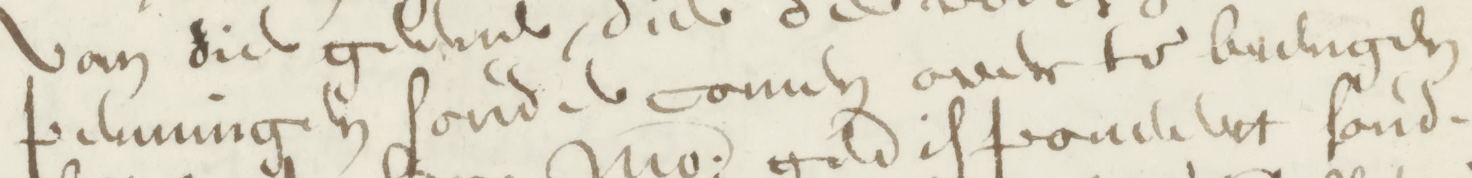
penningen soude comen over te brengen
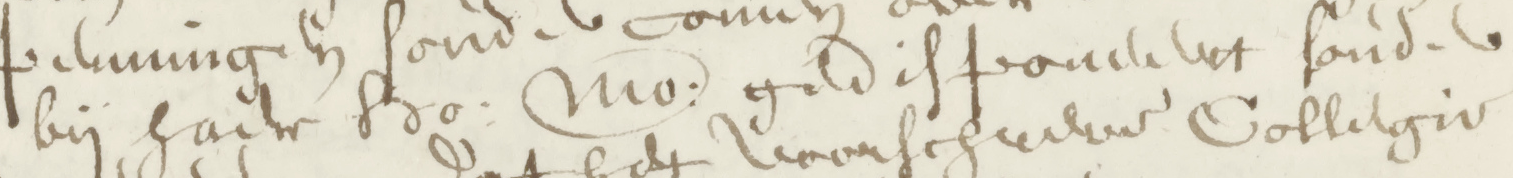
bij haer Ho:Mo: gedisponeert soude
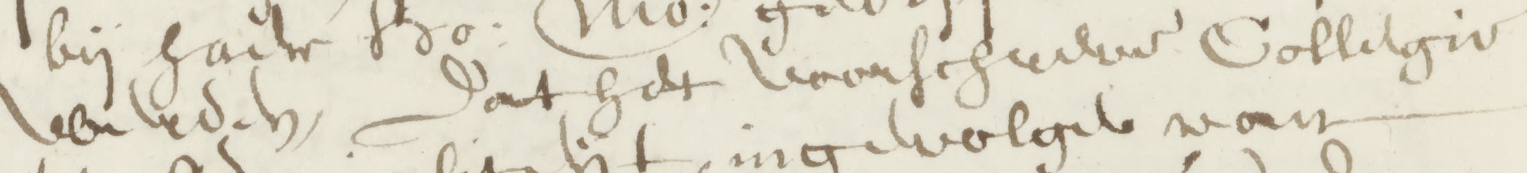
werden, Dat het voorschreve Collegie
